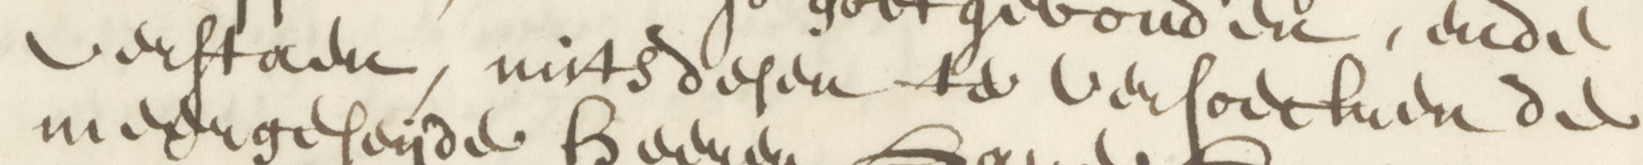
verstaen, mitsdesen te versoecken de
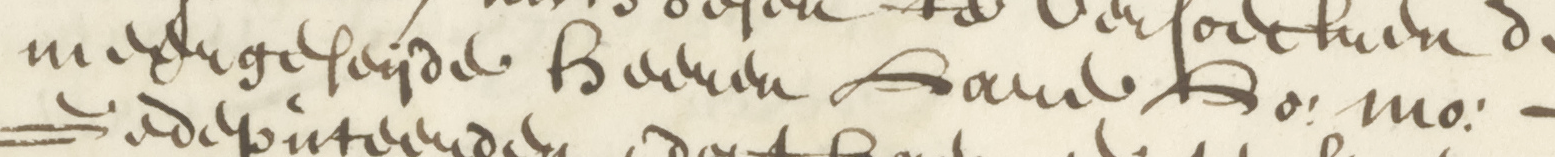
meergeseijde heeren Hare Ho:Mo:
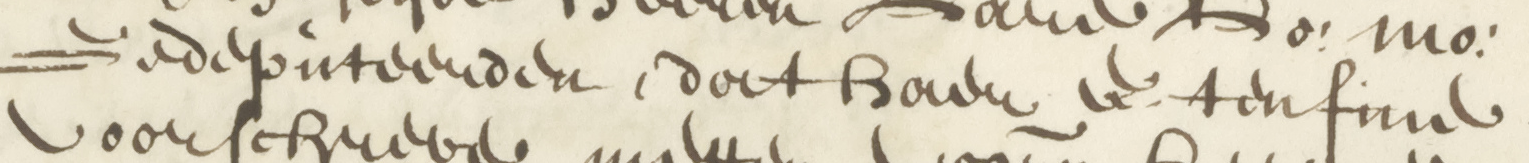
Gedeputeerden, dat haer E. ten fine
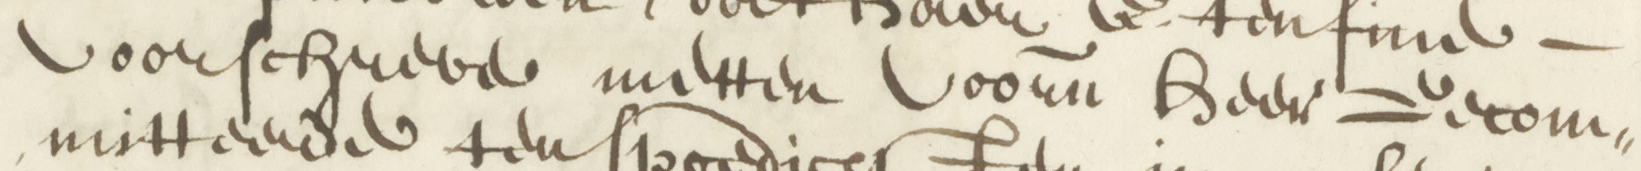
voorschreve metten voorn Heer Gecom„
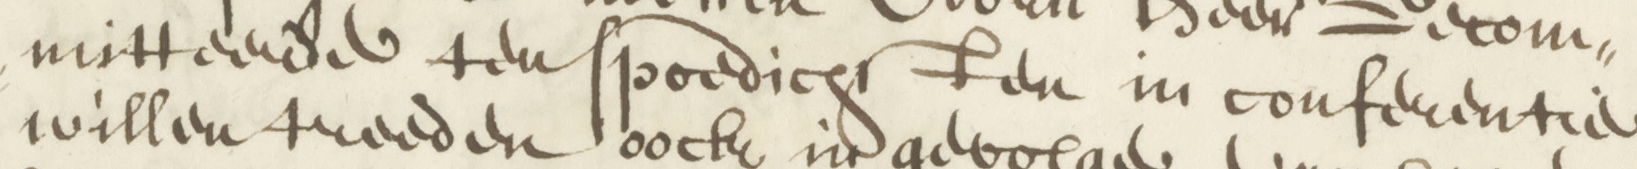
„mitteerde ten spoedichsten in conferentie
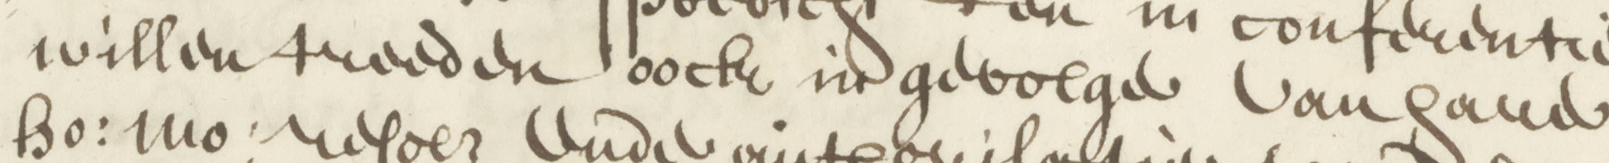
willen treeden oock ingevolge van hare
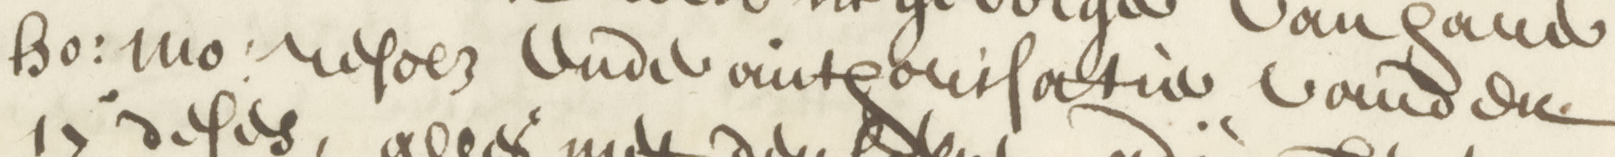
Ho:Mo: resol Ende authorisatie vanden
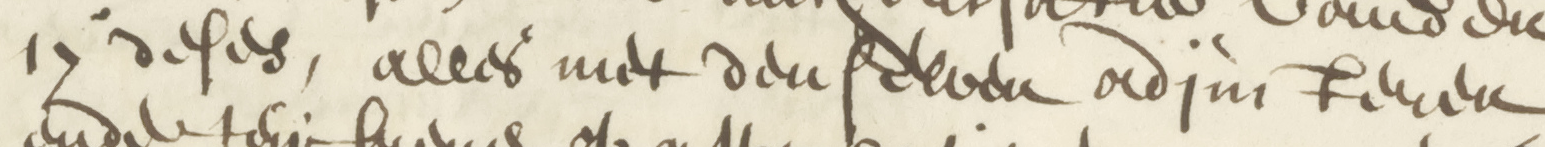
17’ deses, alles met denselven adjusteren
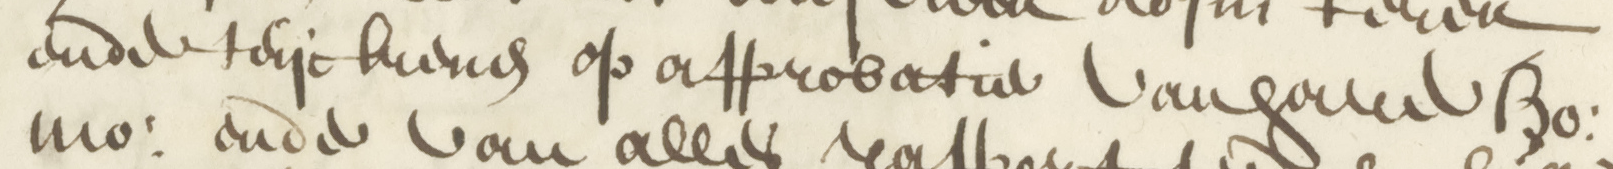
ende teijckenen op approbatie van hare Ho:
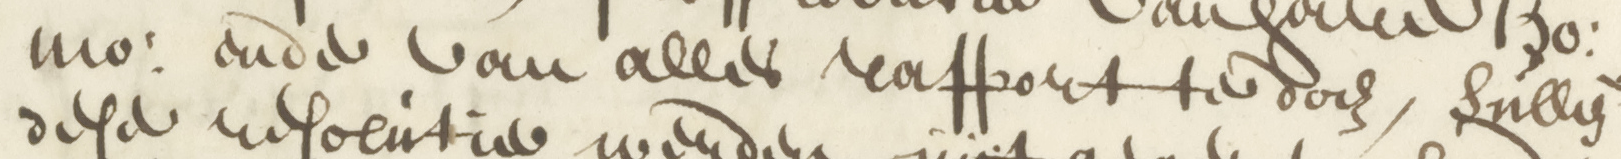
Mo: ende van alles rapport te doen, sullen
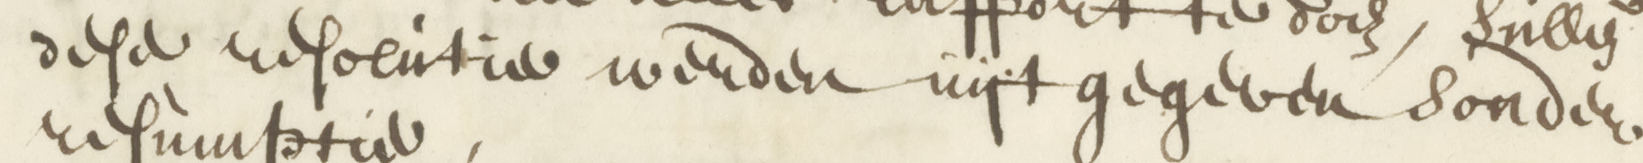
dese resolutie werden uijtgegeven sonder
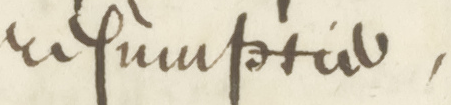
resumptie.
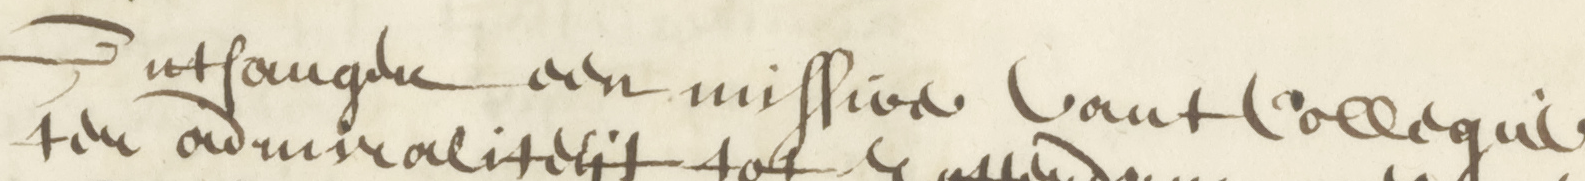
Ontfangen een missive vant Collegie
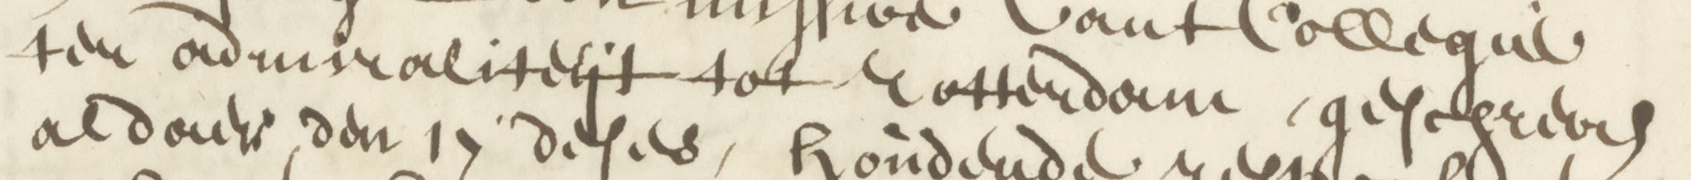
ter admiraliteijt tot Rotterdam, geschreven
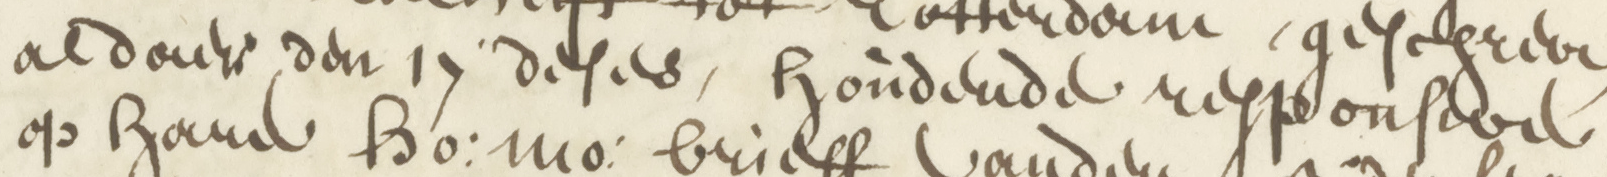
aldaer den 17’ deses, houdende responsive
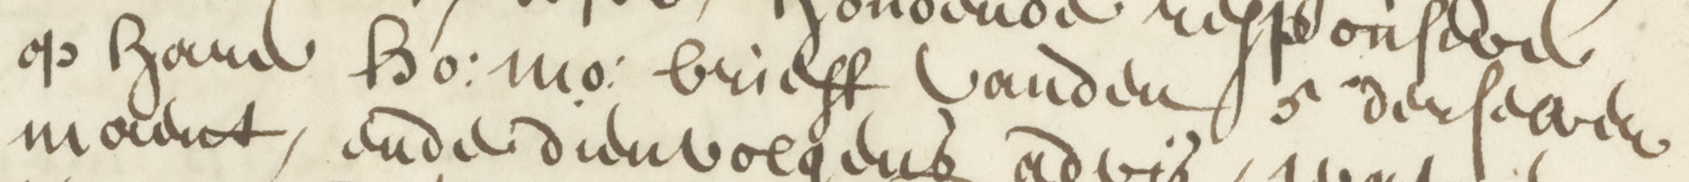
op hare ho:mo: brieff vanden 5’ derselver
